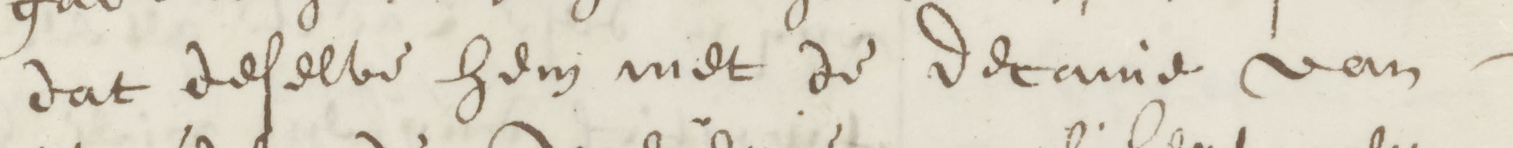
dat deselve hem met de Decanie van
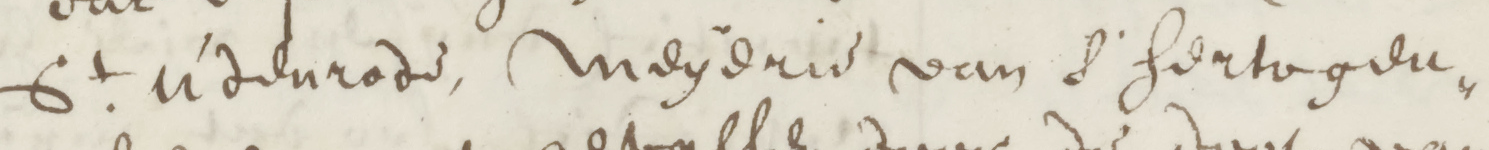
St. Udenrode, Meijerie van s'hertogen„
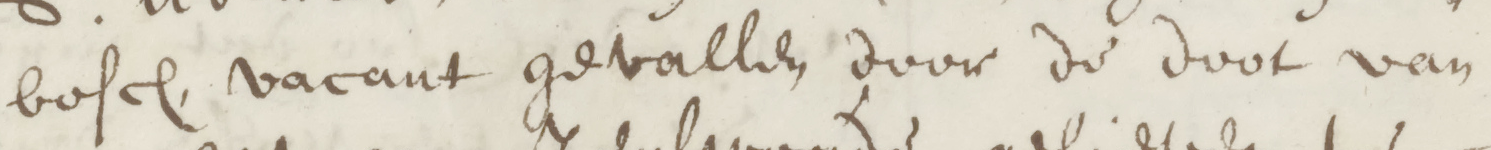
bosch, vacant gevallen door de doot van
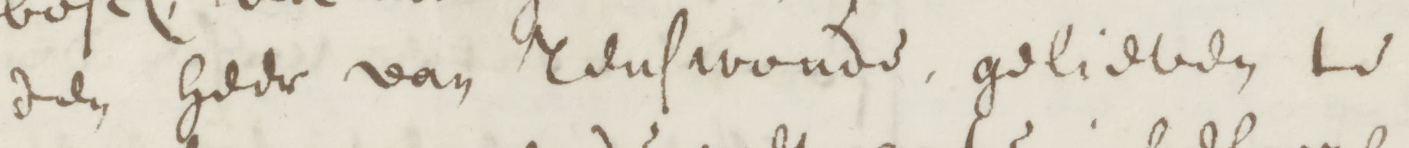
den heer van Renswoude, gelieven te
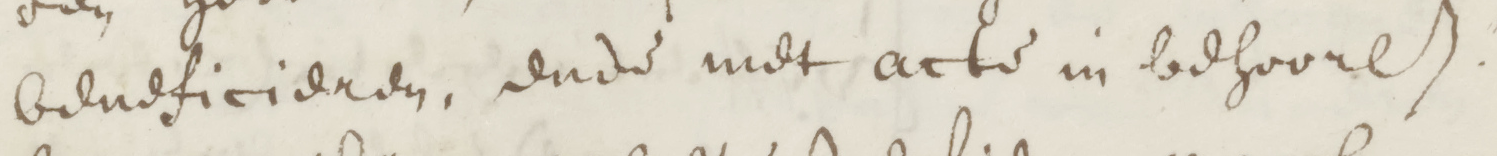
beneficieren, ende met acte in behoorl.
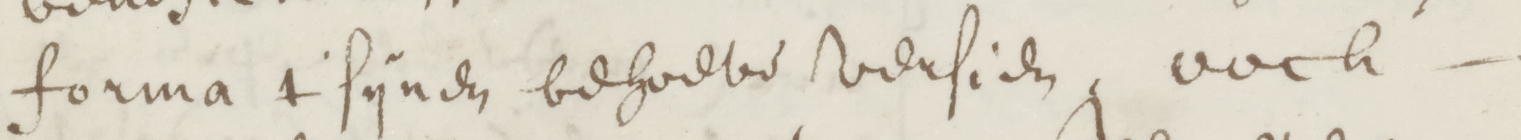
forma t'sijnen behoeve versien, oock -
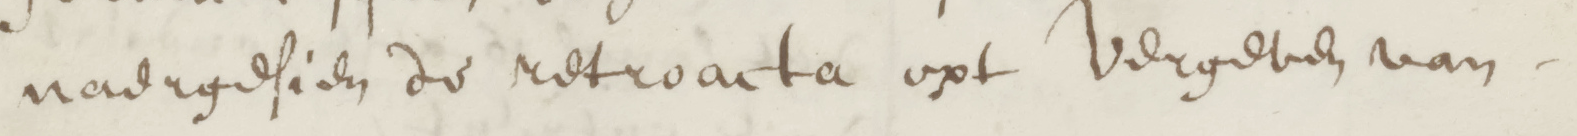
naergesien de retroacta opt Vergeven van
